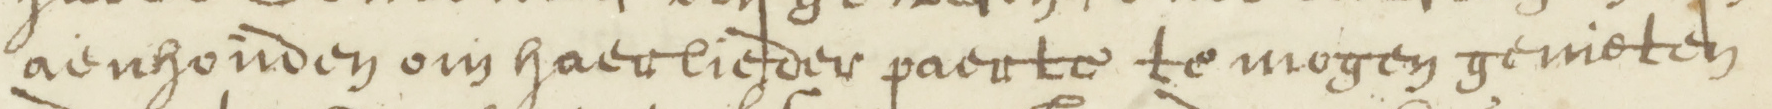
aenhouden om haerlieder paerte te mogen genieten
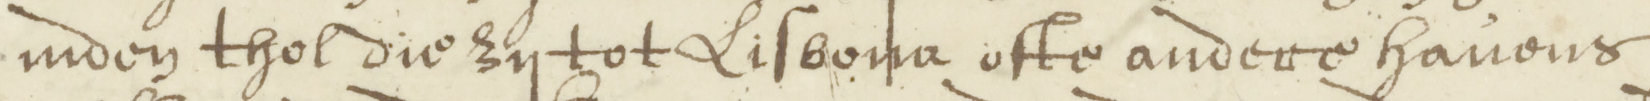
inden thol die zy tot Lisbona ofte andere hauens
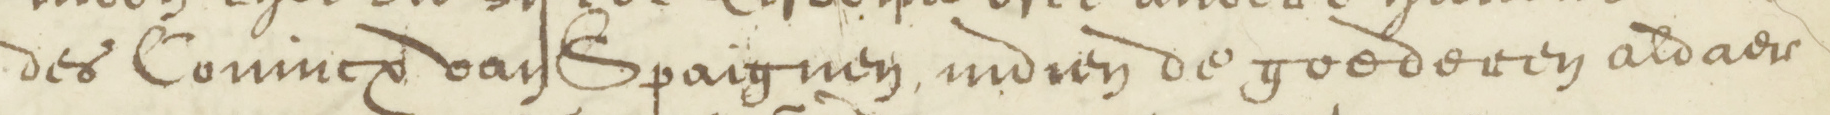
des Conincx van Spaignen, indien de goederen aldaer
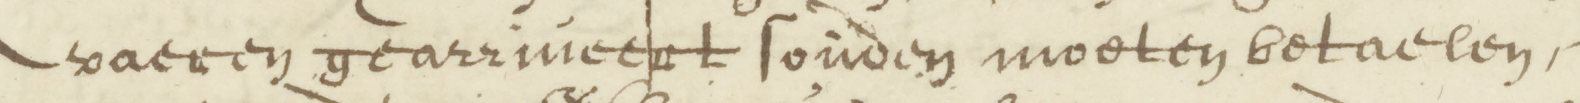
waeren gearriueert souden moeten betaelen.
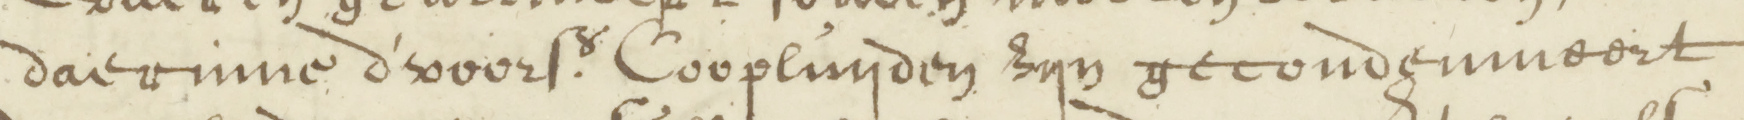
daerinne d'voors. Coopluyden zijn gecondemneert
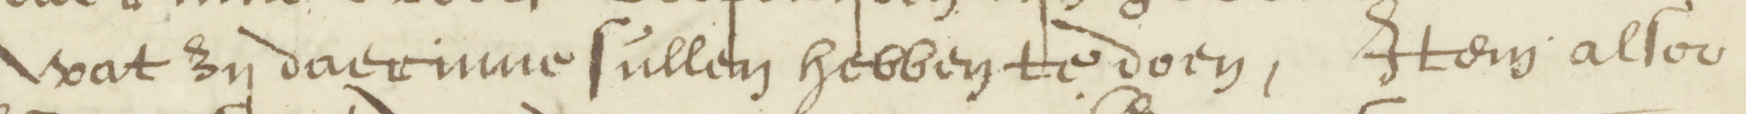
wat zy daerinne sullen hebben te doen, Item alsoe
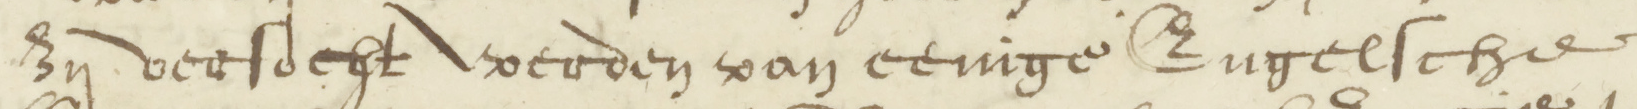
zy versocht werden van eenige Engelsche
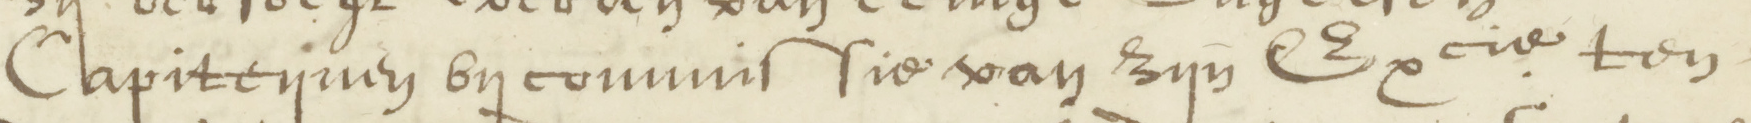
Capiteynen by commissie van zyn Excie ten
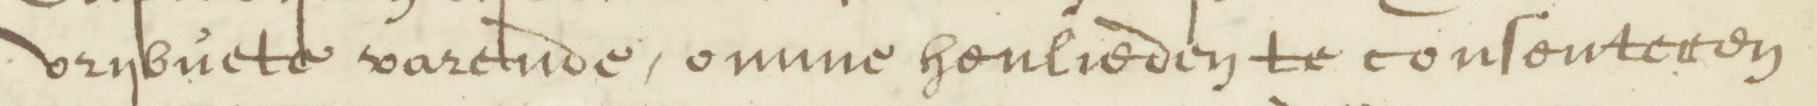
vrybuete varende, omme henlieden te consenteren
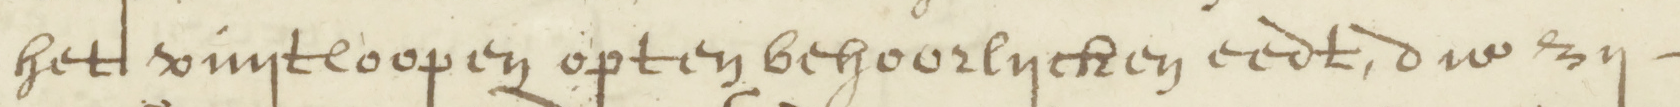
het vuytloopen opten behoorlycken eedt, die zy-
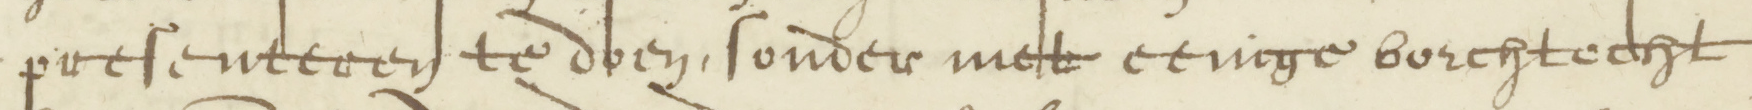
presenteren te doen, sonder met eenige borchtocht
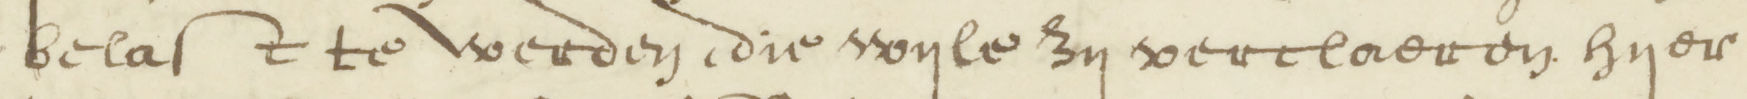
belast te werden, die wyle zy verclaeren hyer
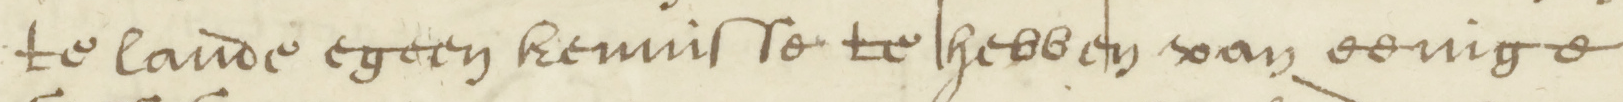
te lande egeen kennisse te hebben van eenige
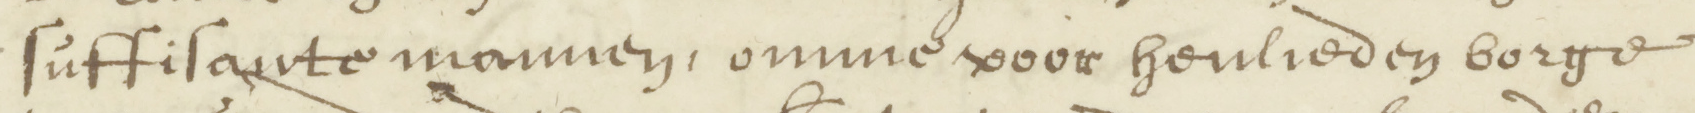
suffisante mannen, omme voor henlieden borge
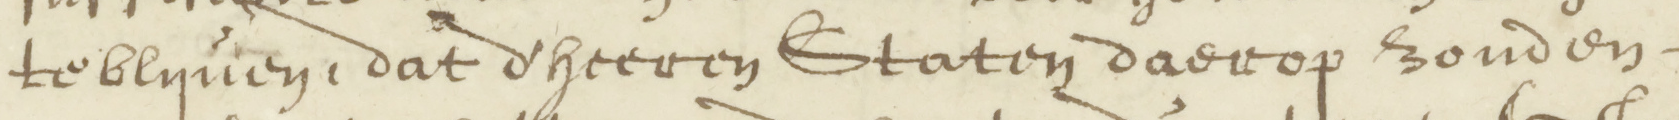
te blyuen, dat d'heeren Staten daerop zouden
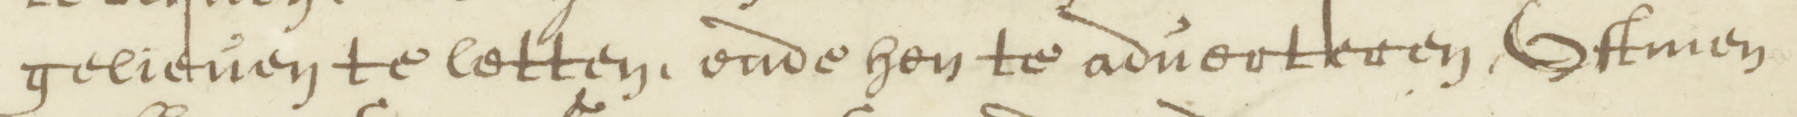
gelieuen te letten, ende hen te aduerteren, Oftmen
